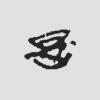是
